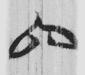穴
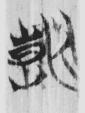朝
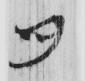夕
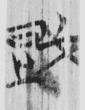{豆戈}
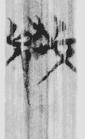{兒戈}
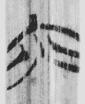亦
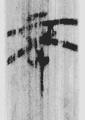不
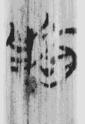{爿兔}
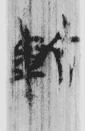斬
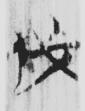伐
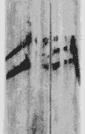今
